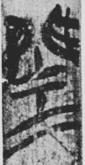閨
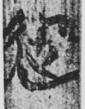○（卜）
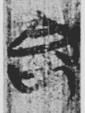命（令）
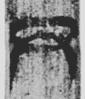尹
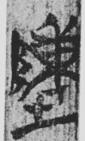○（陳）
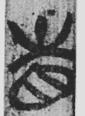省
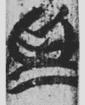爲
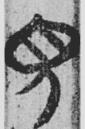○（視）
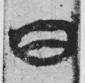日
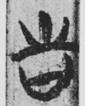告
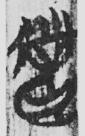○（僕）
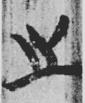之
